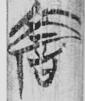○（顔）
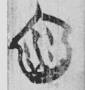囦（淵）
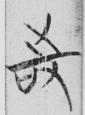○（侍）
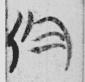於
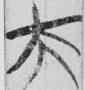夫夫
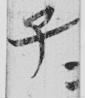子子
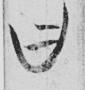曰
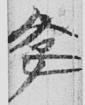韋（回）
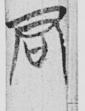君
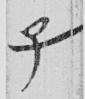子
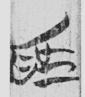爲
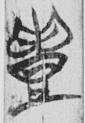豊（禮）
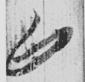㠯（以）
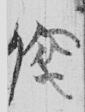依
